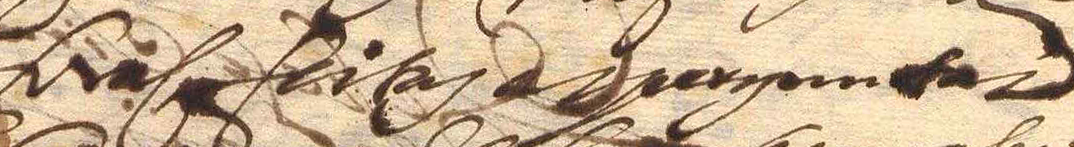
foraꝭ feitas as perguntaz
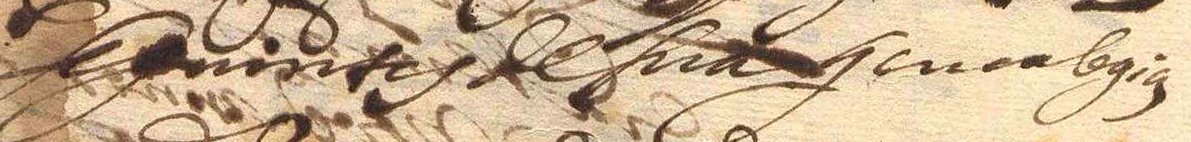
seguintes de sua Genealogia
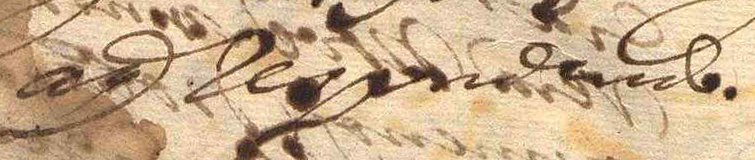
a q̄ Respondendo.
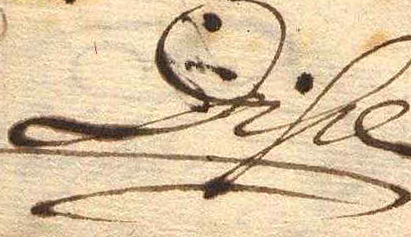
Disse
